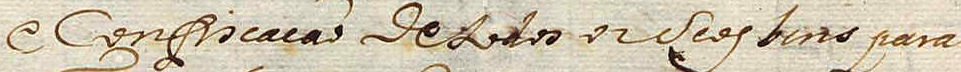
e Confiscaçaõ de todos os Seos bens para.
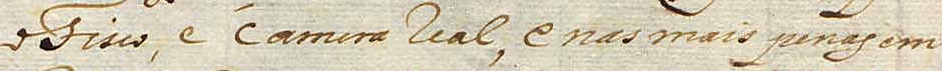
o Fisco, e camera Real, e nas mais penas em
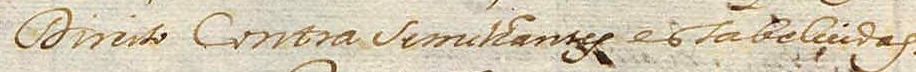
Direito Contra semelhantes estabelecidas.
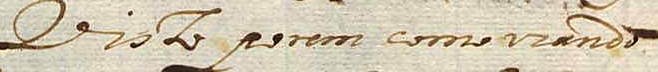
Visto porem como vzando
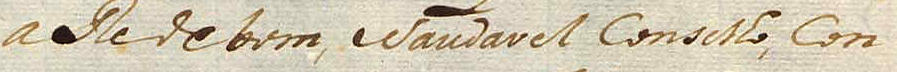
a Re de bom, e saudavel Conselho, Con
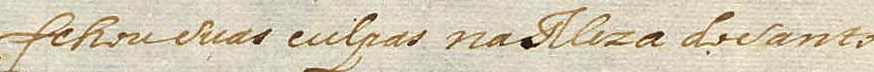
fessou suas culpas na Meza do santo
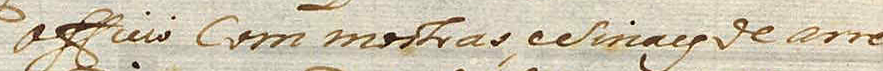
officio Com mostras, e sinaes de arre
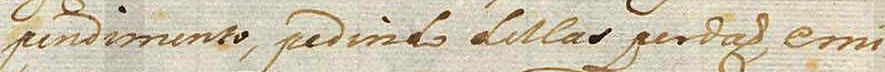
pendimento, pedindo dellas perdaõ, e mi
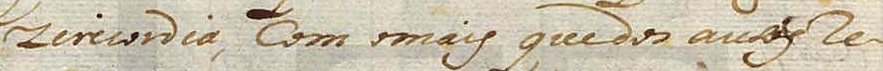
zericordia, com o mais que dos autos Re
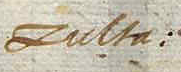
zulta:
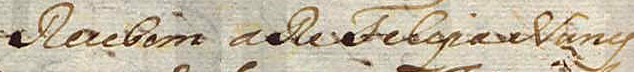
Recebem a Re Felipa Nunes
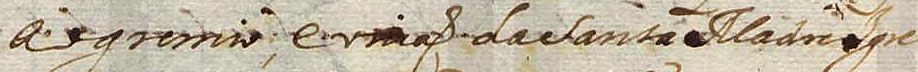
ao gremio, e vniaõ da Santa Madre Igre
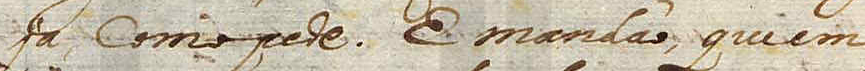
ja, Como pede. E mandaõ, que em
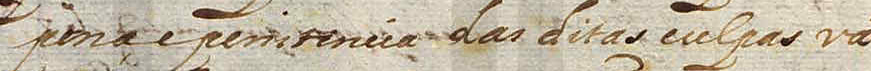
pena, e penitencia das ditas culpas vá
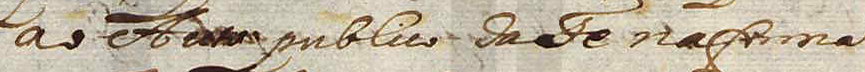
ao Auto publico da Fe na forma
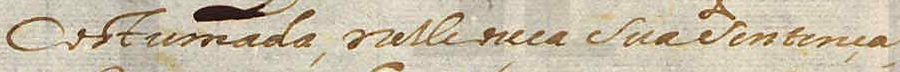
Costumada, nelle ouça sua sentença
